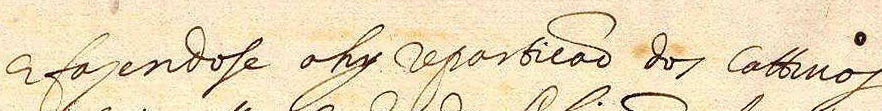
E fazendose ahy repartição dos cattiuos
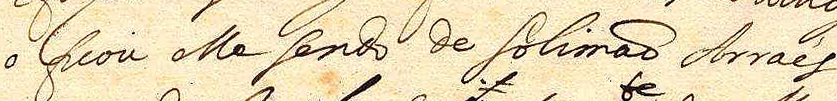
o ficou elle sendo de Solimaõ Arraes
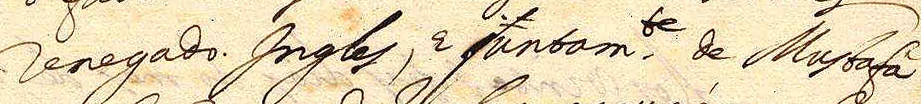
renegado. Jngles, e juntam.te de Mustafá
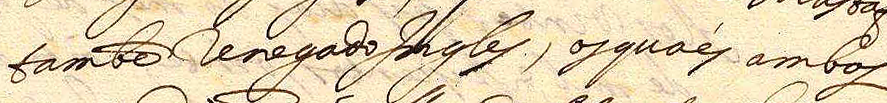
tambē Renegado Ingles, os quaes ambos
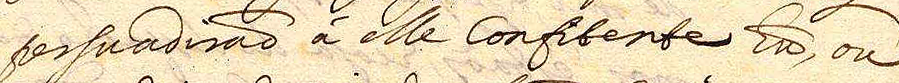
persuadiraõ á elle confitente hū, ou
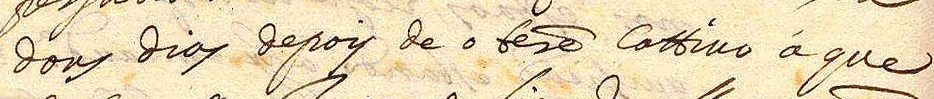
dous dias depois de o ter cattiuo a que
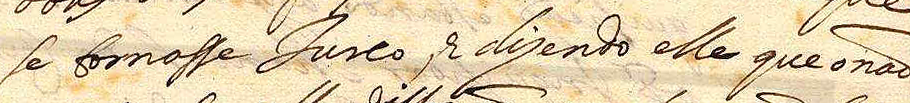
se tornasse turco, E dizendo elle que o naõ
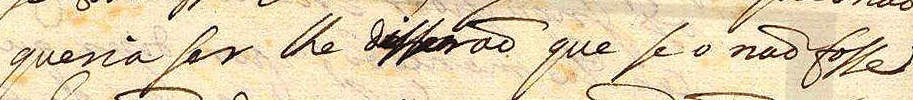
queria ser lhe disserão que se o não fosse
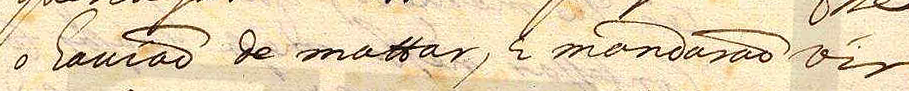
o hauião de mattar, E mandarão vir
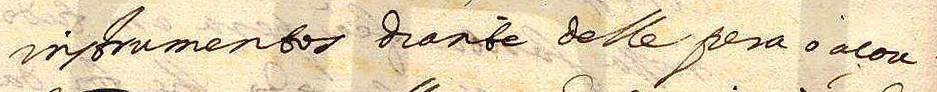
instrumentos diante delle pera o açou
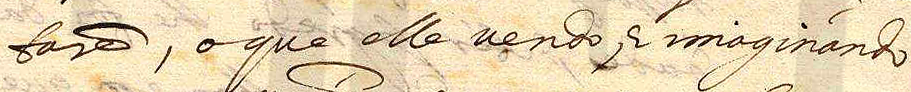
tarem, o que elle uendo, E imaginando
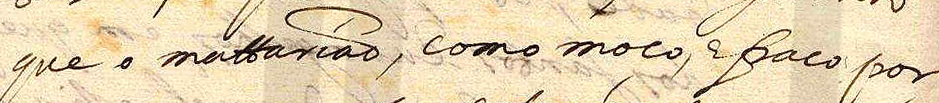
que o mattarião, como moço, e fraco por
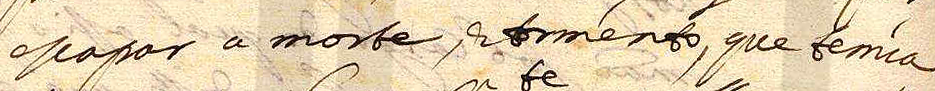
escapar a morte, e tormento, que temía
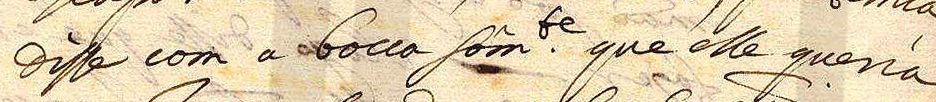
disse com a boca somte que elle queria
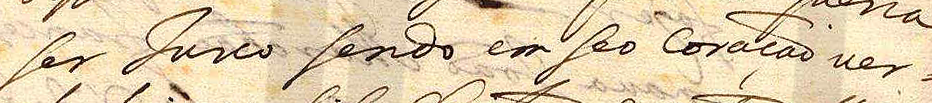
ser turco sendo em seo coraçaõ uer
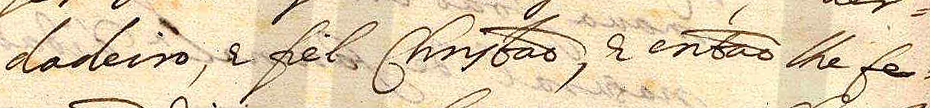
dadeiro, e fiel Christão, E então lhe fe
